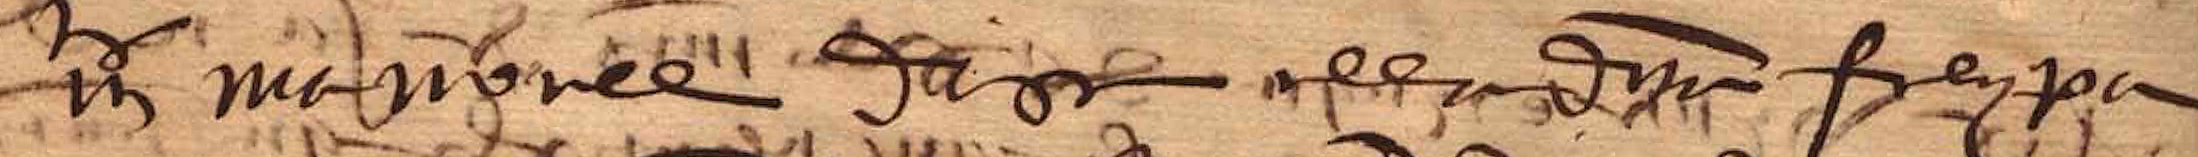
mte manoell dise ella dita felypa
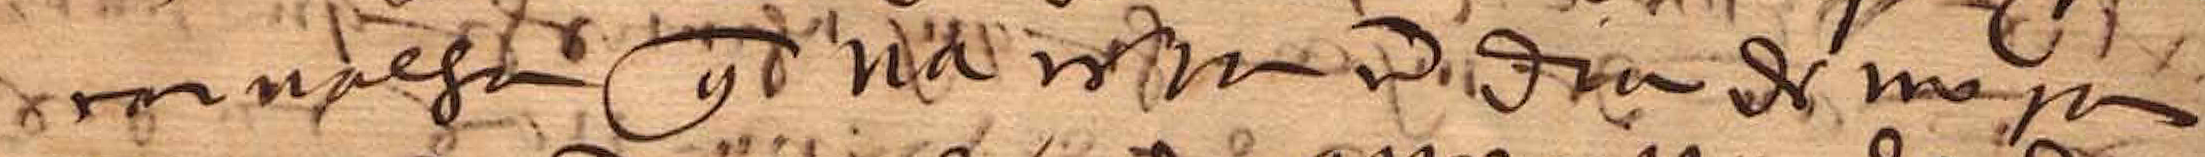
carualha q̄ naçera ē dia de nosa
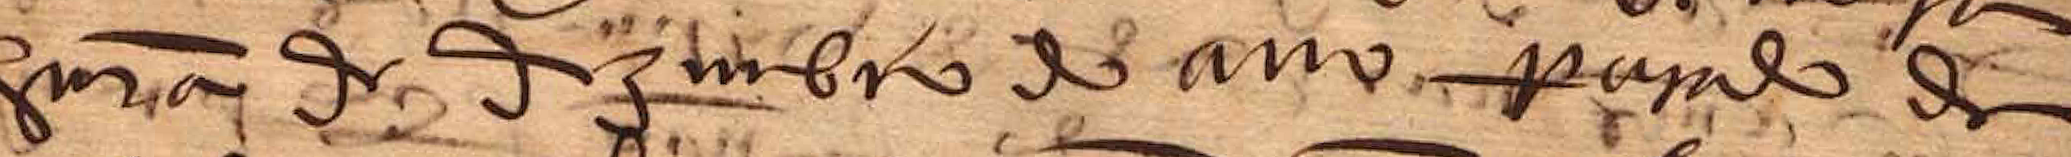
Snr̄a de dezenbro do ano pasado de
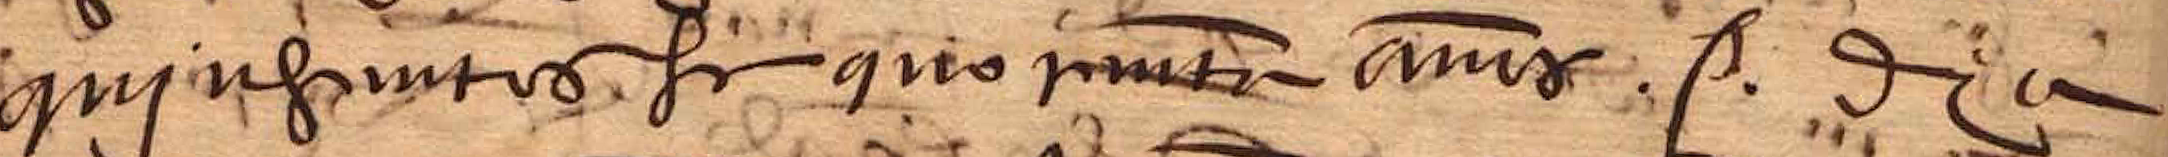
qujnhemtos he quoremta an̄os .s. dya
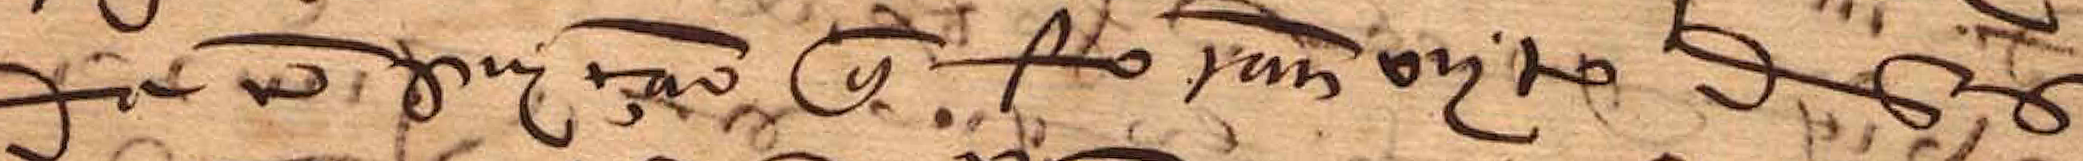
da c̄oseyção q̄ for̄an oyto dias
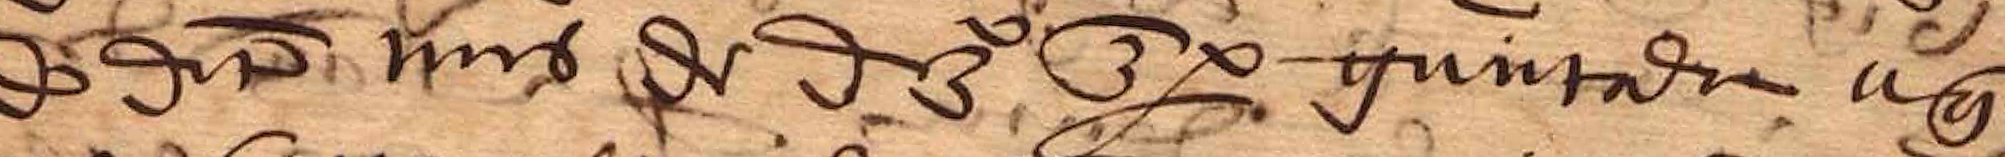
do dito mes de dezo item ꝑguntada a q̄
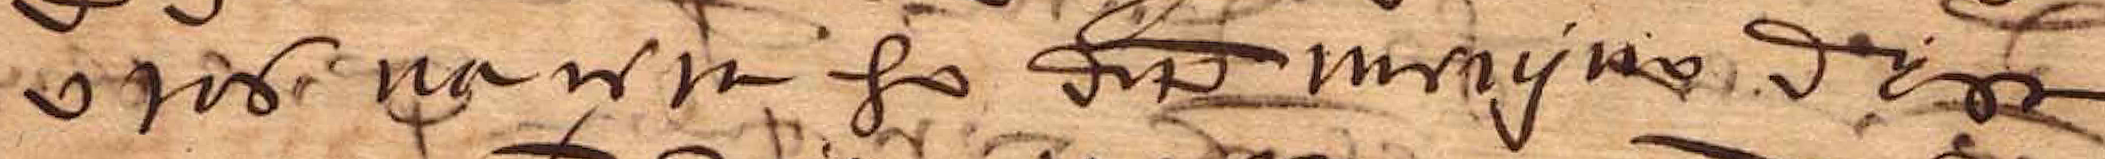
oras naçera ho dito menjno dyse
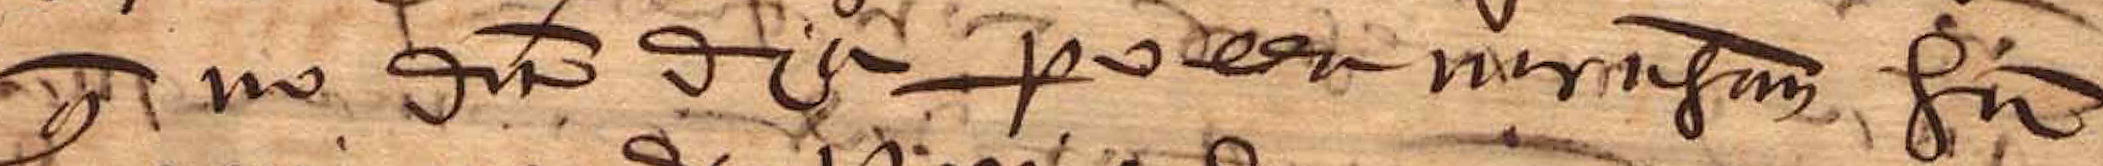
q̄ no dito dya polla menhan hū
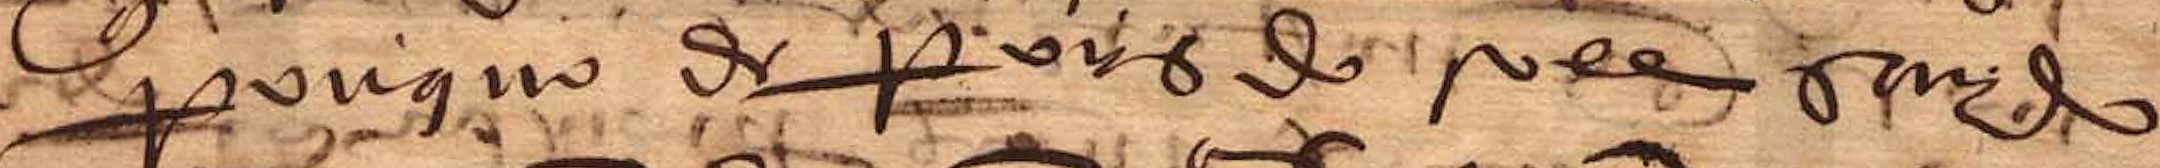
pouquo depoys do soll saydo
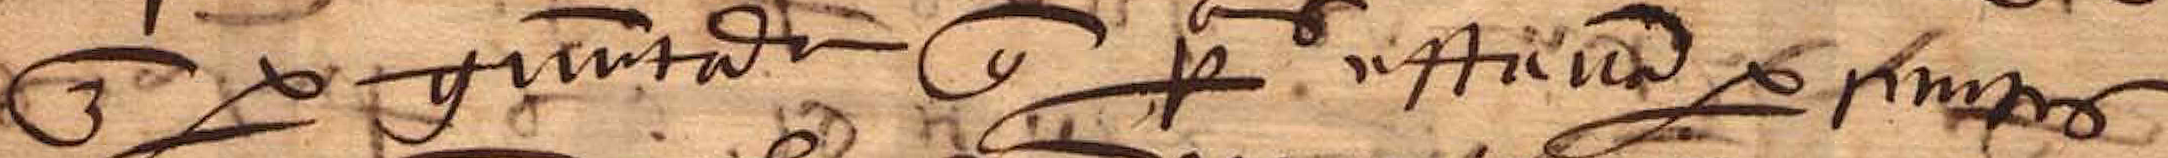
item ꝑguntada q̄ pas estauā ꝑsemtes
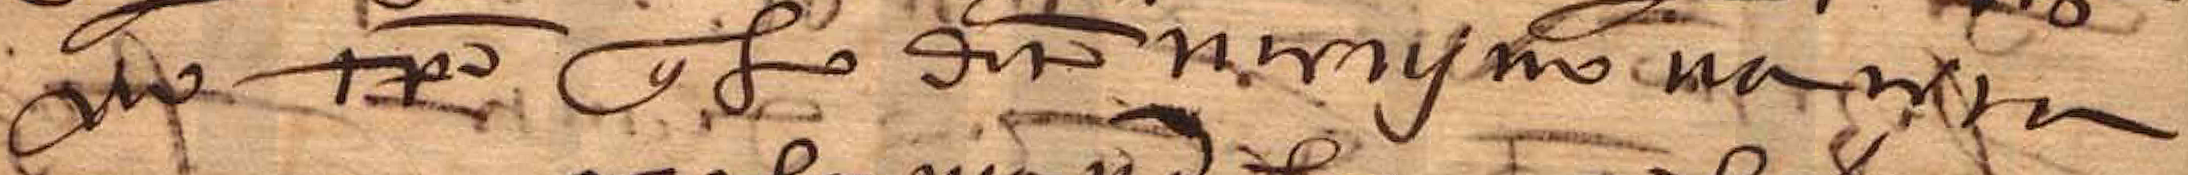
ao tp̄o q̄ ho dito menjno naçera
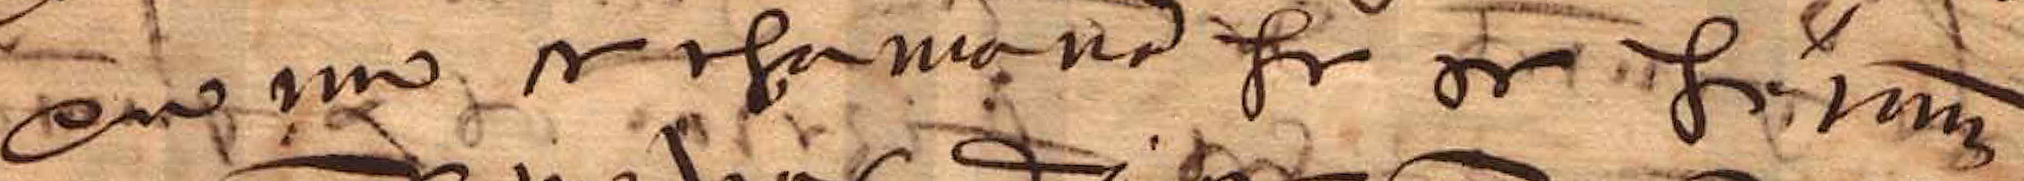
e como se chamauā he se heram
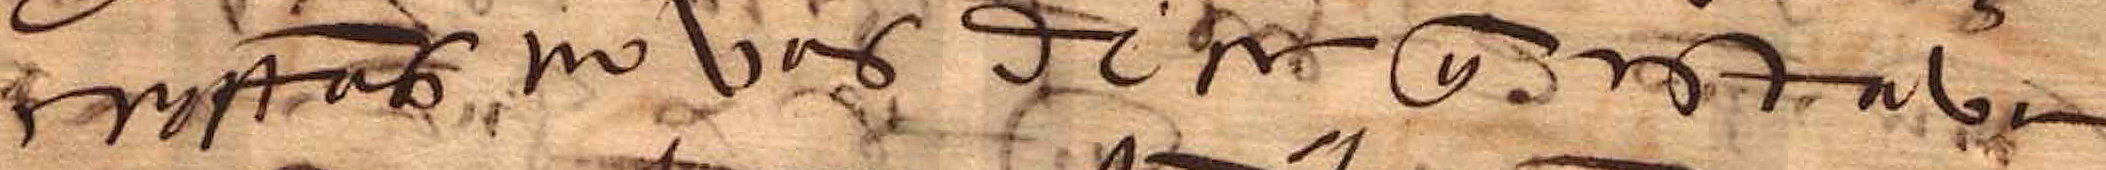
crystās novas dyse q̄ estava
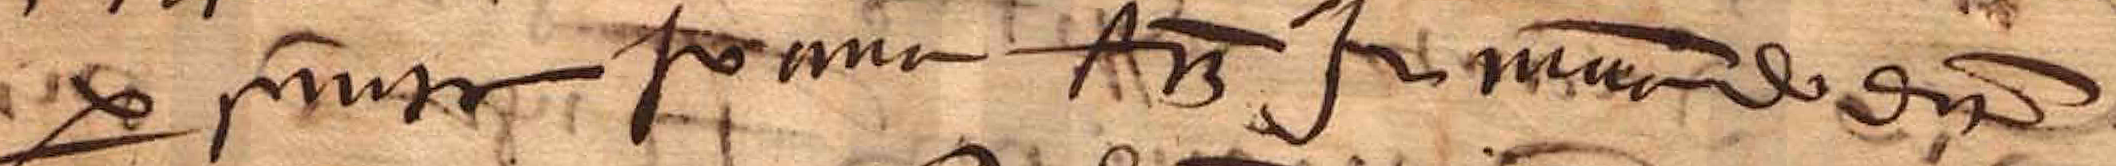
ꝑsemte Joana fr̄z Jrmāa do dito
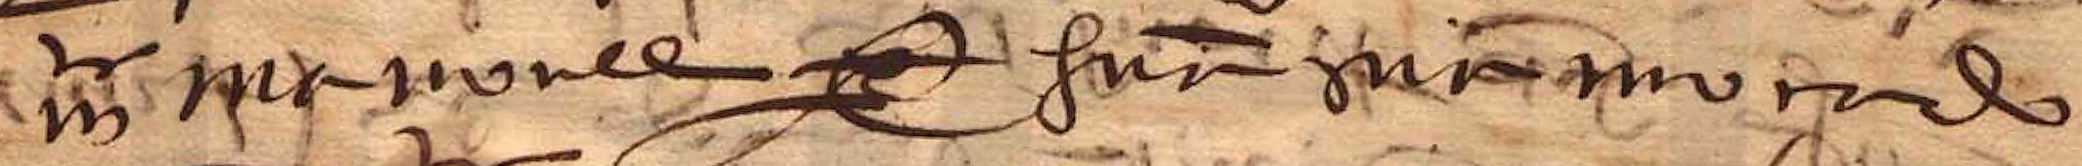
mte manoell _ huā sua moça do
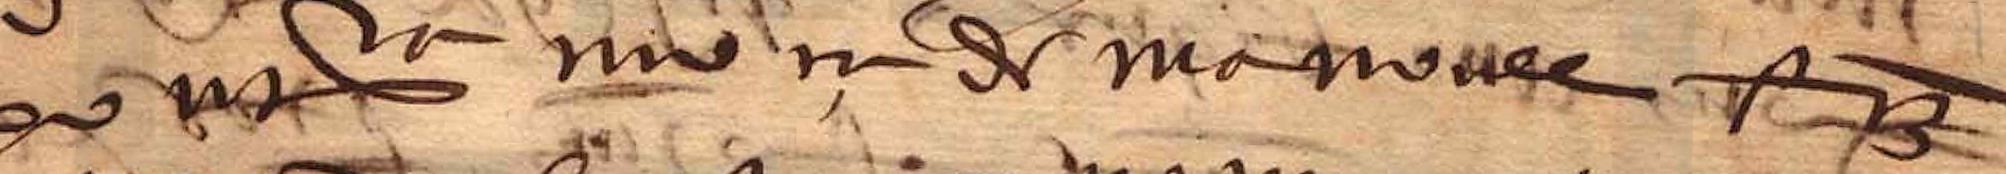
e outra moça de manoell fr̄z
